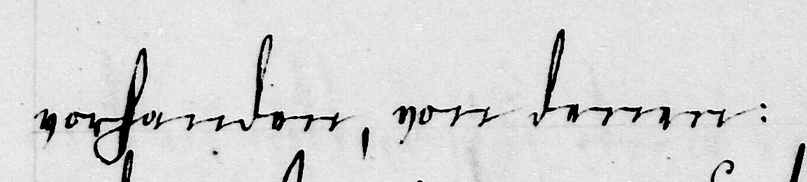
vorhanden, von denen:
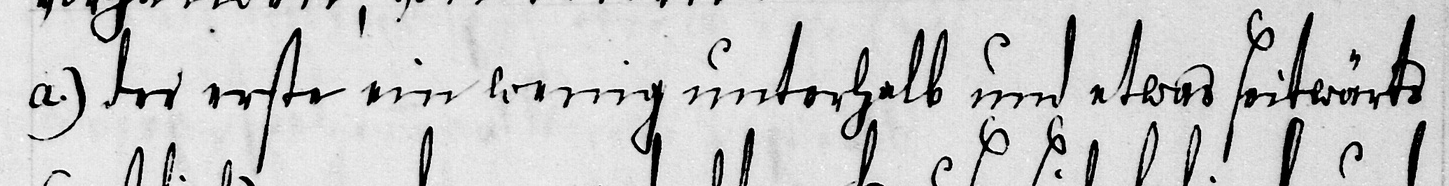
a.) Der erste ein wenig unterhalb und etwas seitwärts
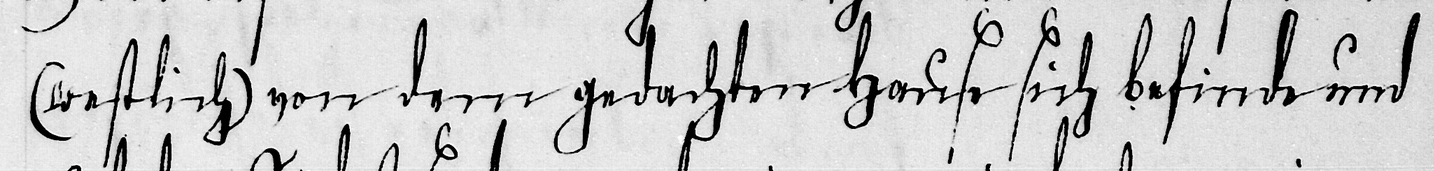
(westlich) von dem gedachten Hause sich befinde und
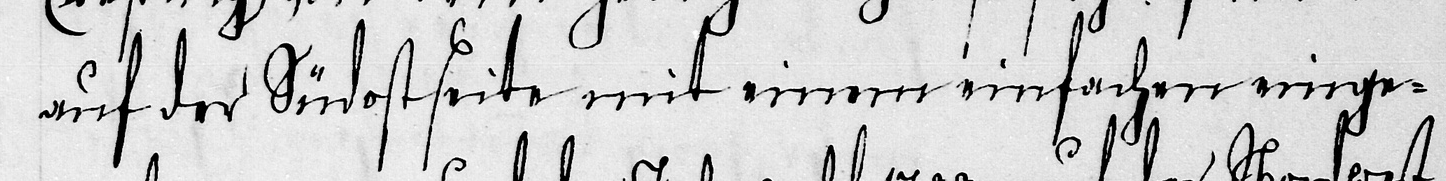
auf der Südostseite mit einem einfachen einge¬
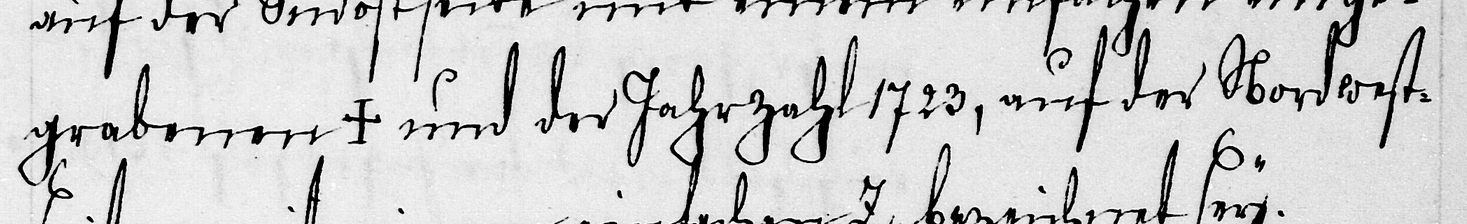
grabenen + und der Jahrzahl 1723, auf der Nordwest¬
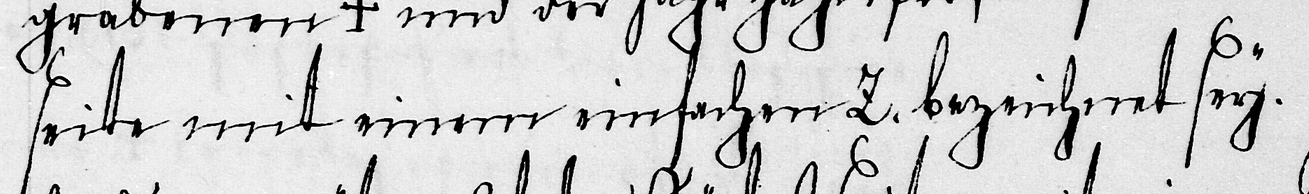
seite mit einem einfachen Z. bezeichnet sey.
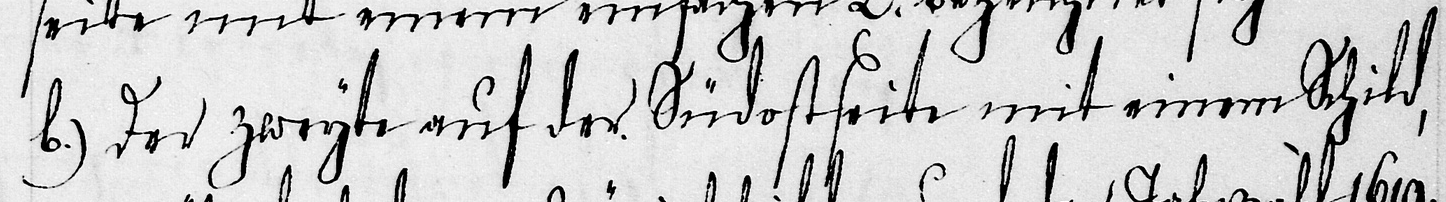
b.) Der zweyte auf der Südostseite mit einem Schild,
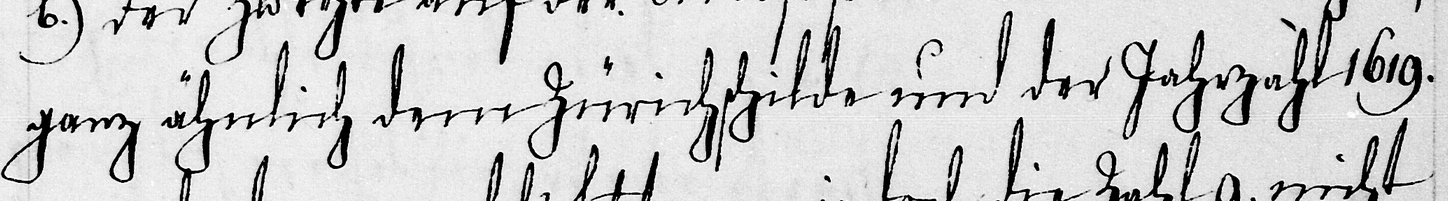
ganz ähnlich dem Zürichschilde und der Jahrzahl 1619.
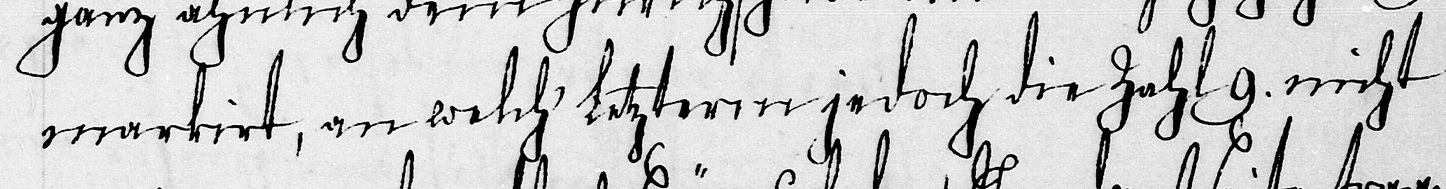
markirt, an welch’ Letzterm jedoch die Zahl 9. nicht
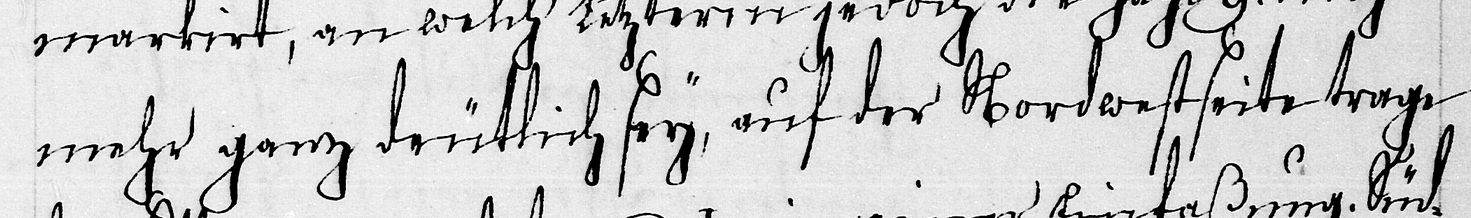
mehr ganz deutlich sey, auf der Nordwestseite trage
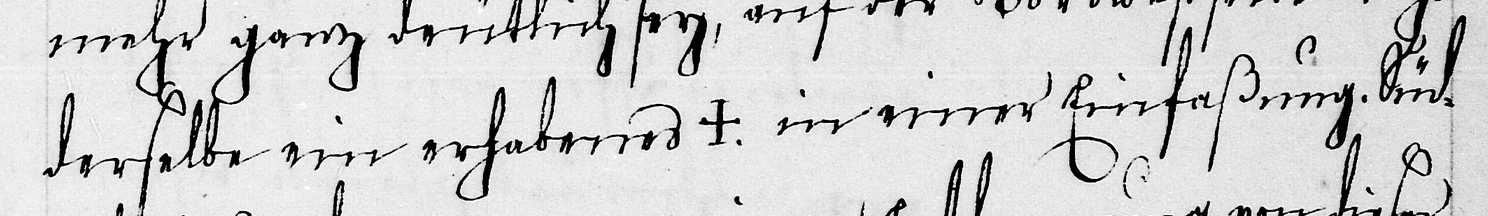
derselbe ein erhabenes +. in einer Einfaßung. Süd¬
